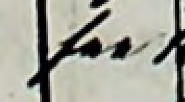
see
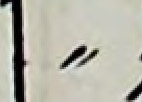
„
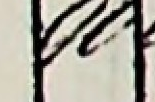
90
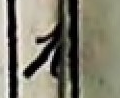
1?
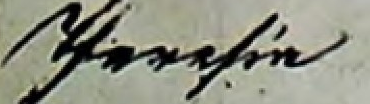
Theresia
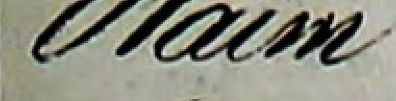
Haim
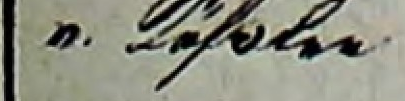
v. Kösoler
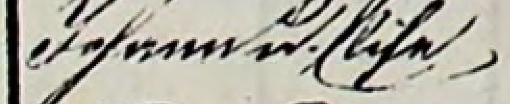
Johann u. Elise
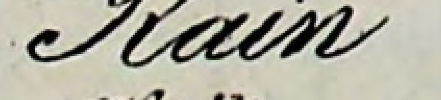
Kain
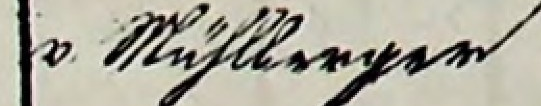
v. Mühllerger
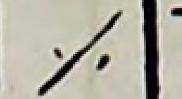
./.
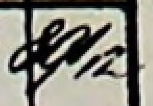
891,2
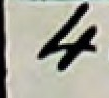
4
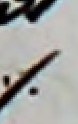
./.
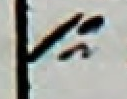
12
